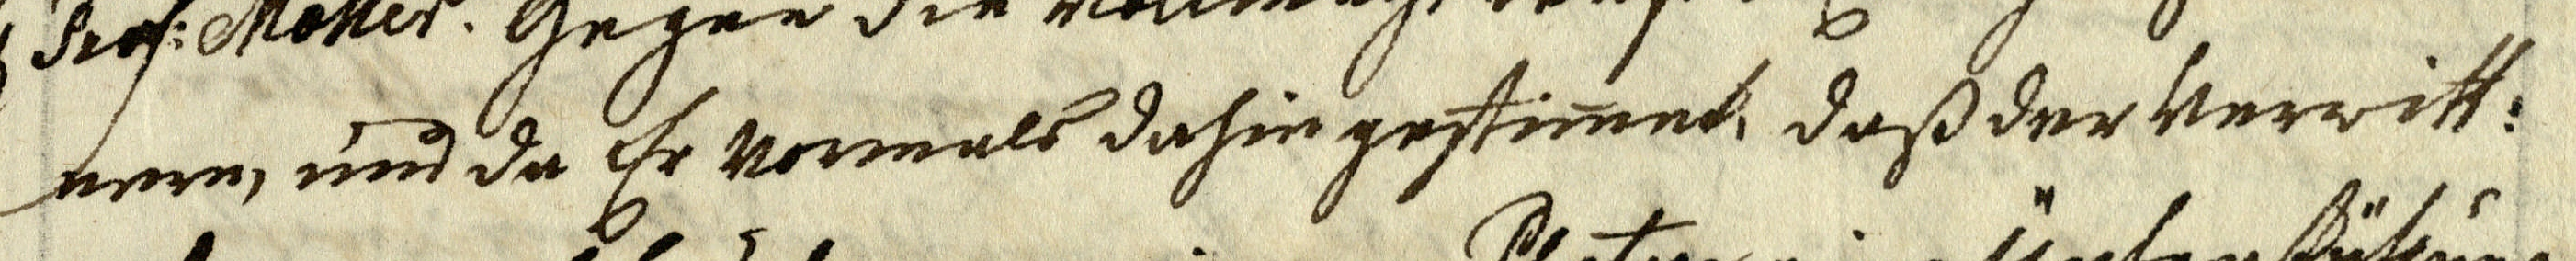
nern, und da Er vormals dahin gestimet, daß der Verwitt¬
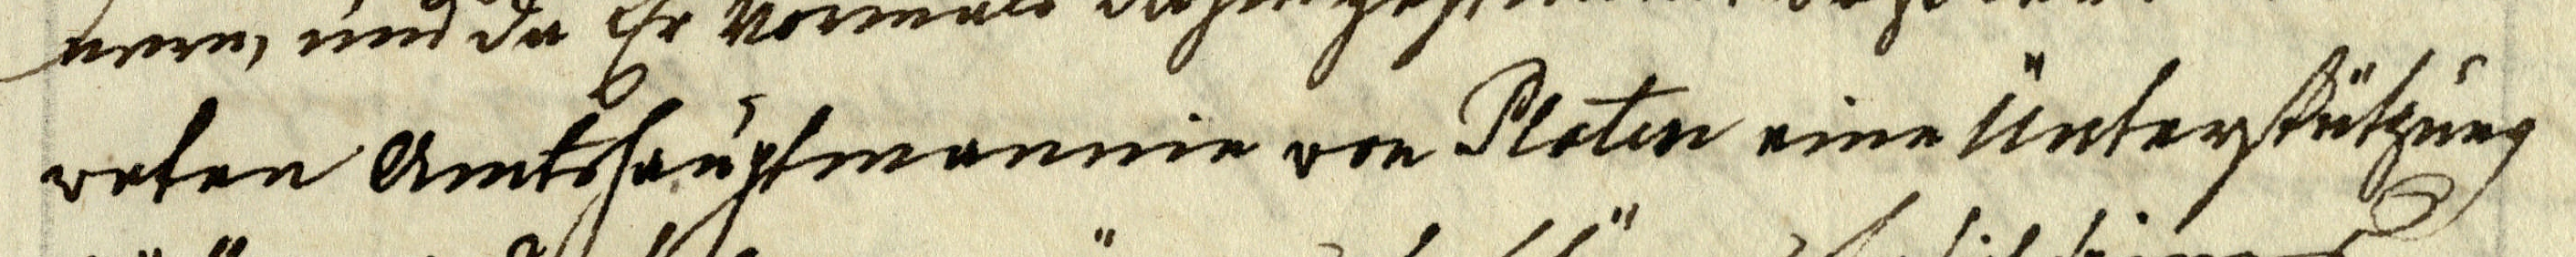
weten Amtshauptmannin von Platen eine Unterstützung
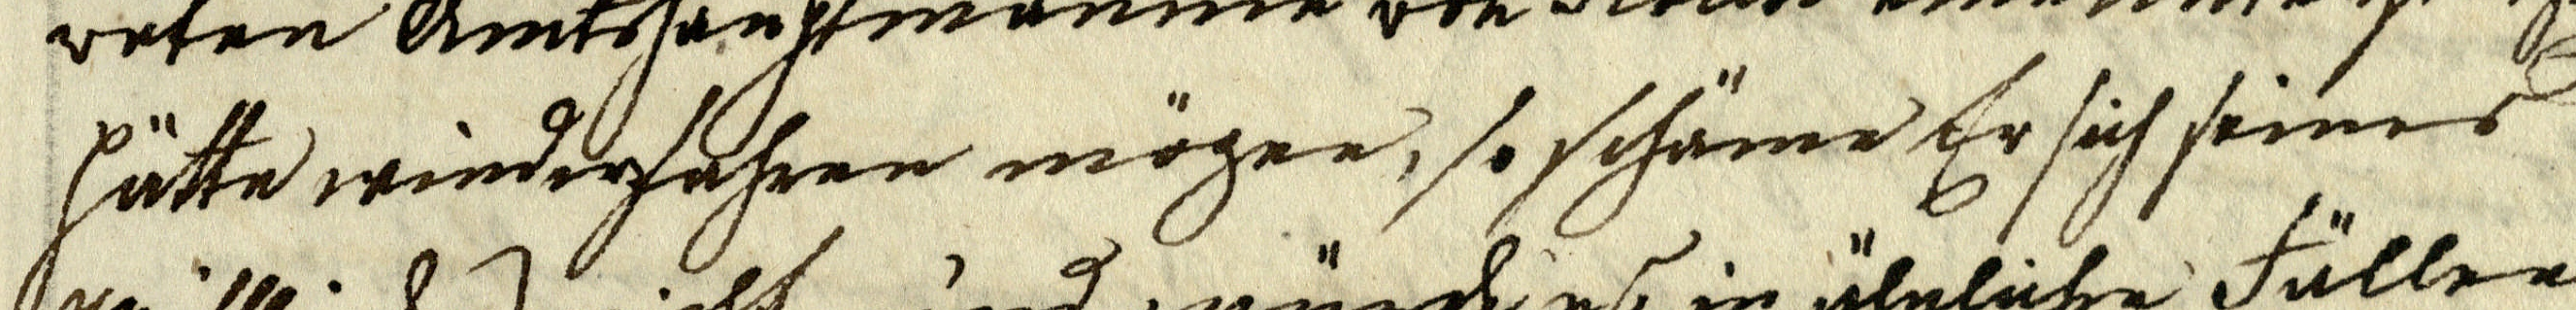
hätte wiederfahren mögen, so schäme Er sich seines
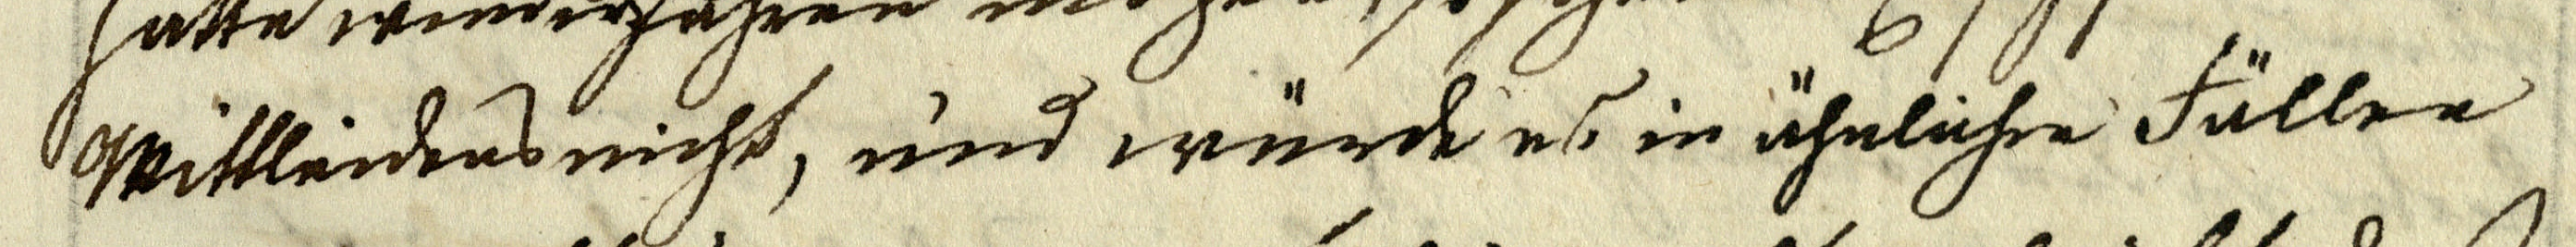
Mittleidens nicht, und würde es in ähnlichen Fällen
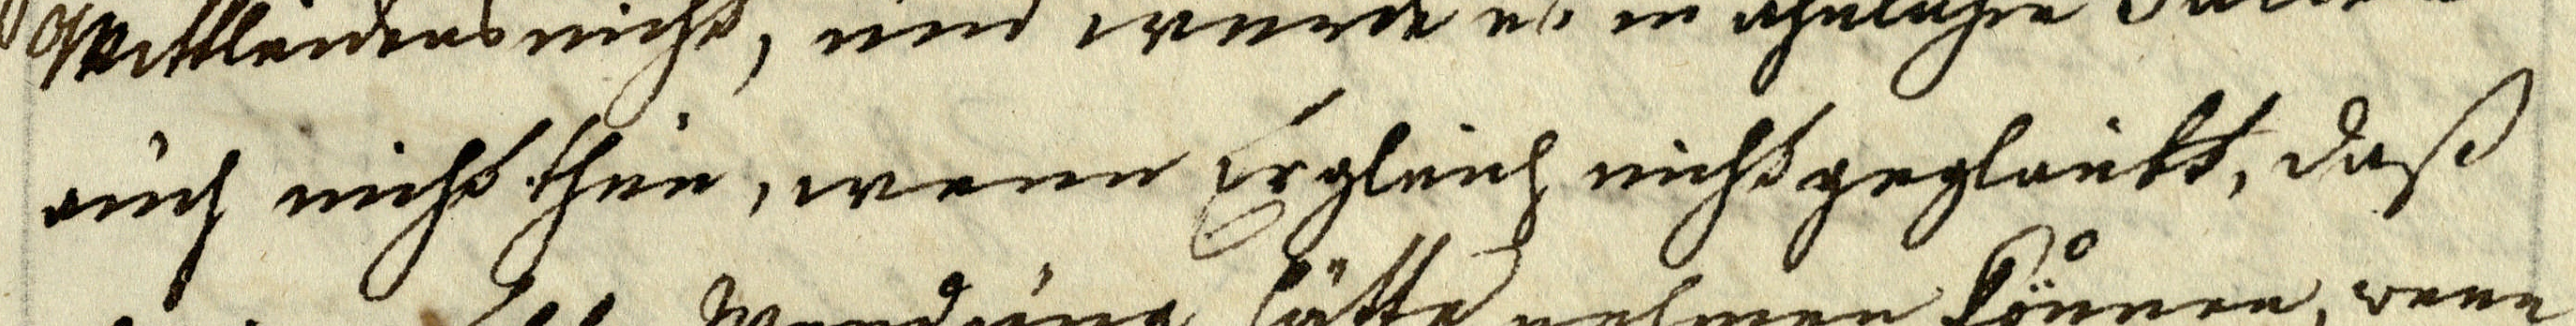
auch nicht thun, wenn Er gleich nicht geglaubt, daß
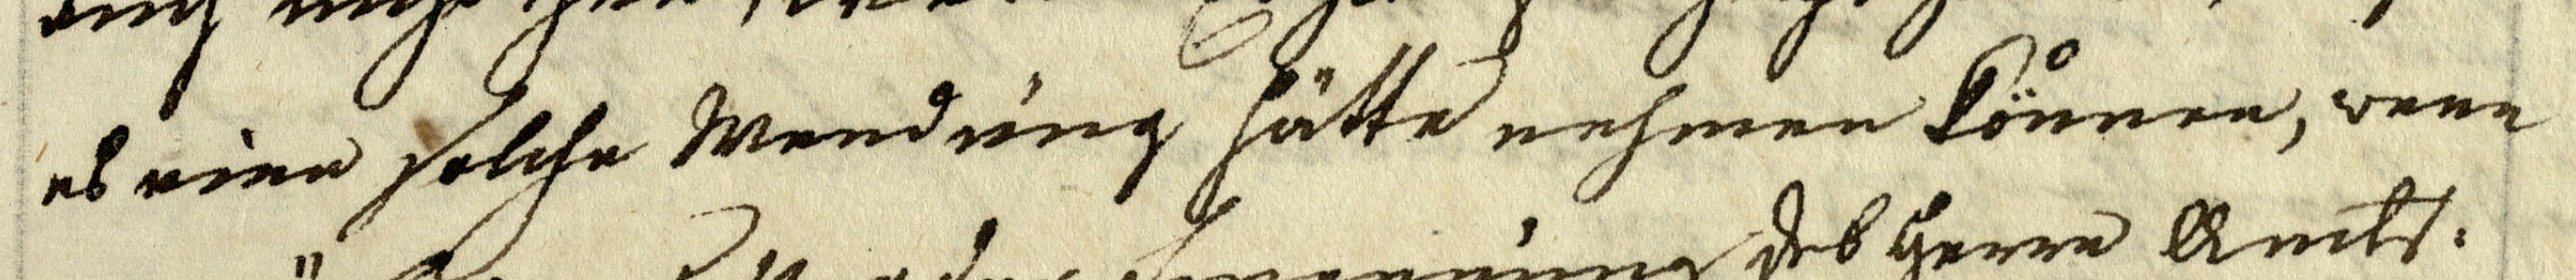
es eine solche Wendung hätte nehmen können, wenn
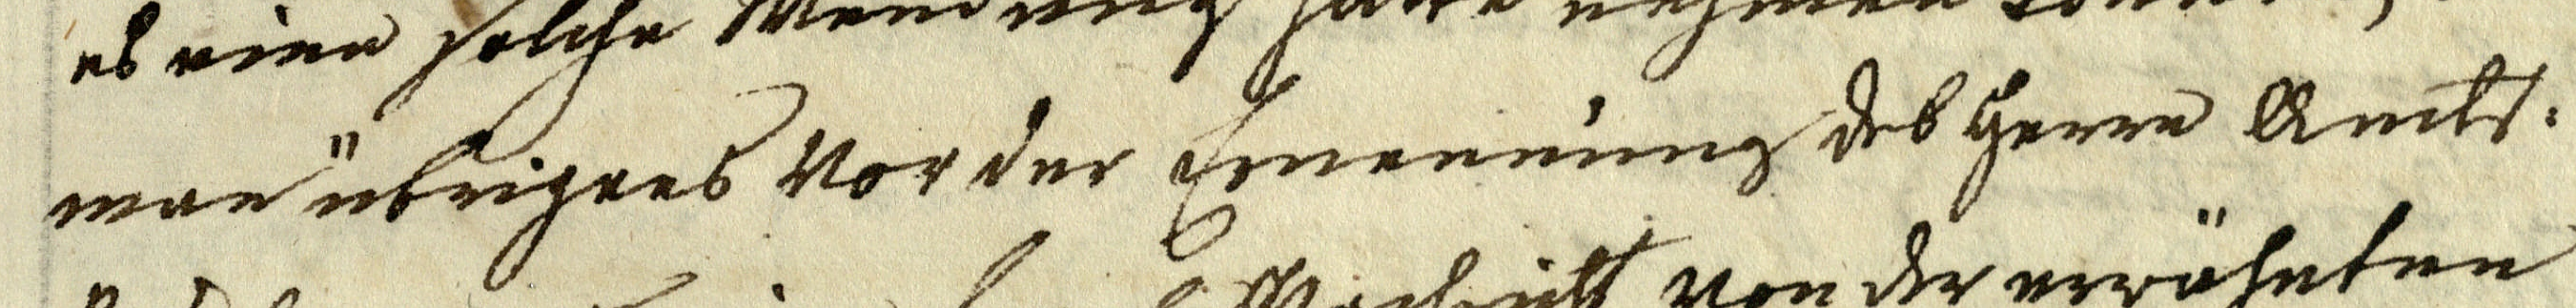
man übrigens vor der Ernennung des Herrn Amts¬
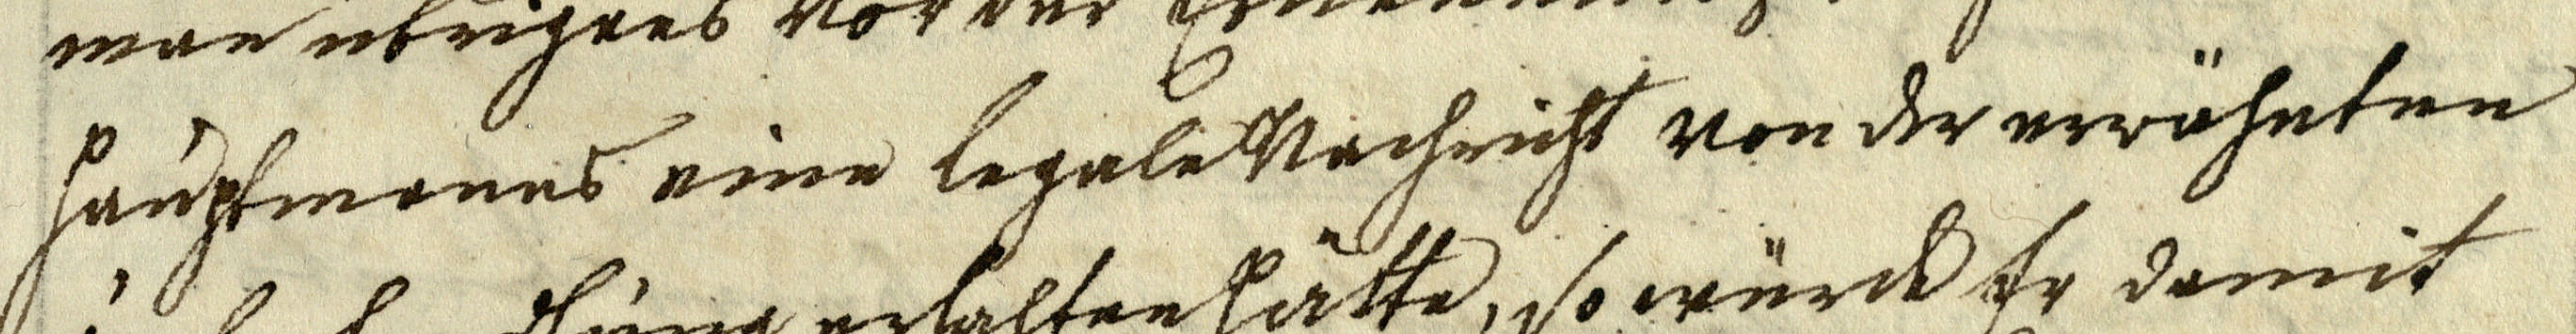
hauptmanns eine legale Nachricht von der erwähnten
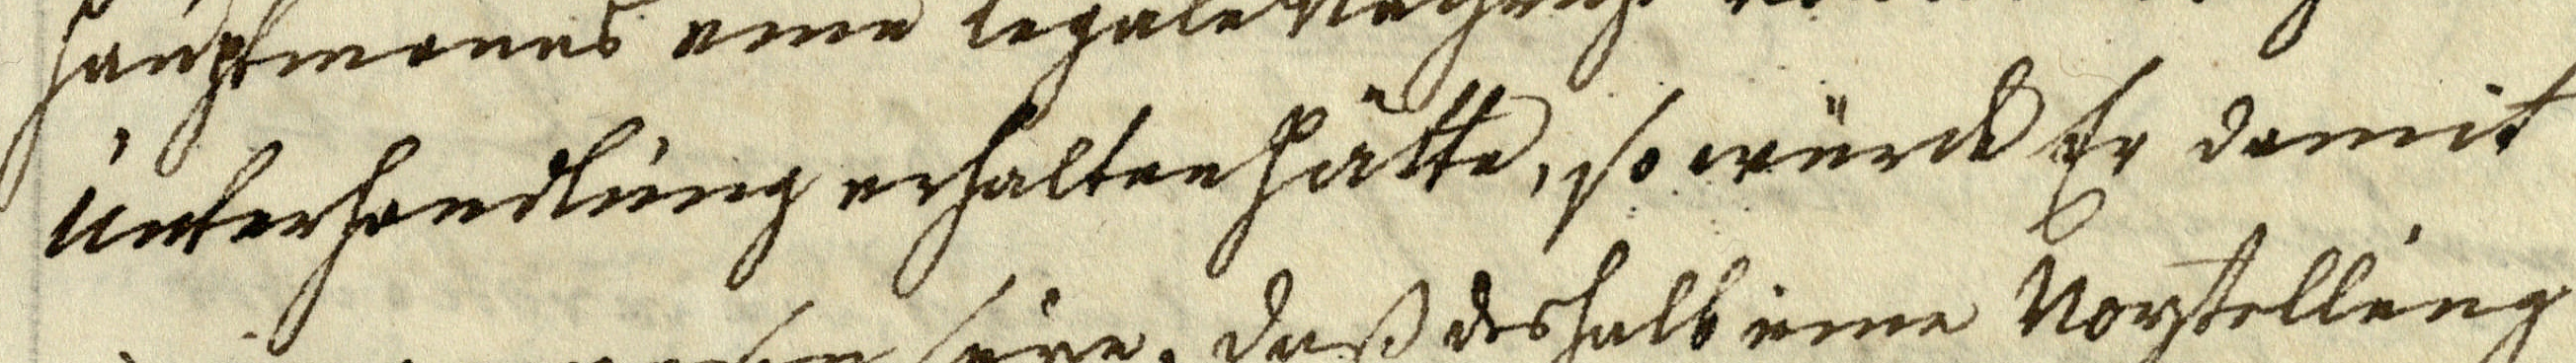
Unterhandlung erhalten hätte, so würde Er damit
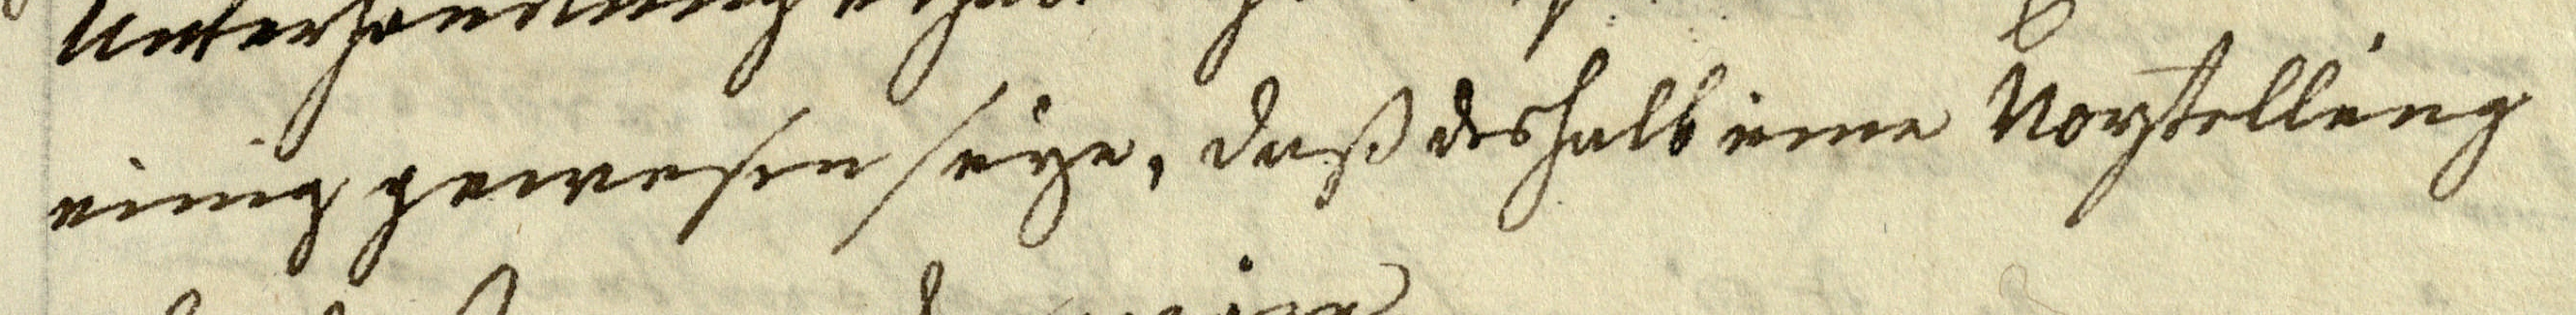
einig gewesen seÿn, daß deshalb eine Vorstellung
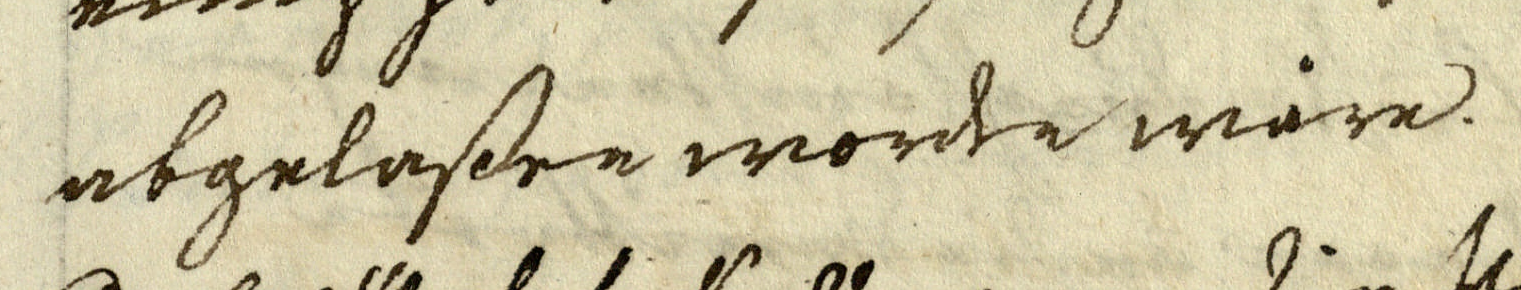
abgelassen worden wäre.
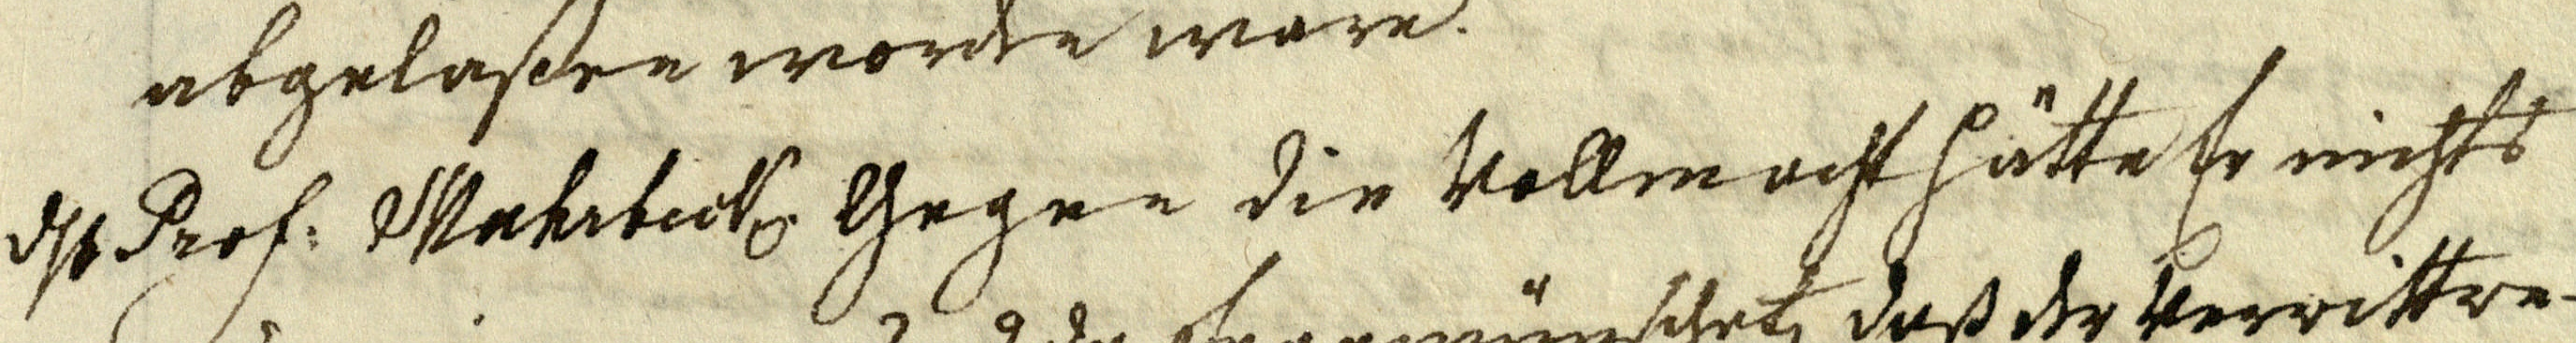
dh. Prof. Muhrbeck. Gegen die Vollmacht hätte Er nichts
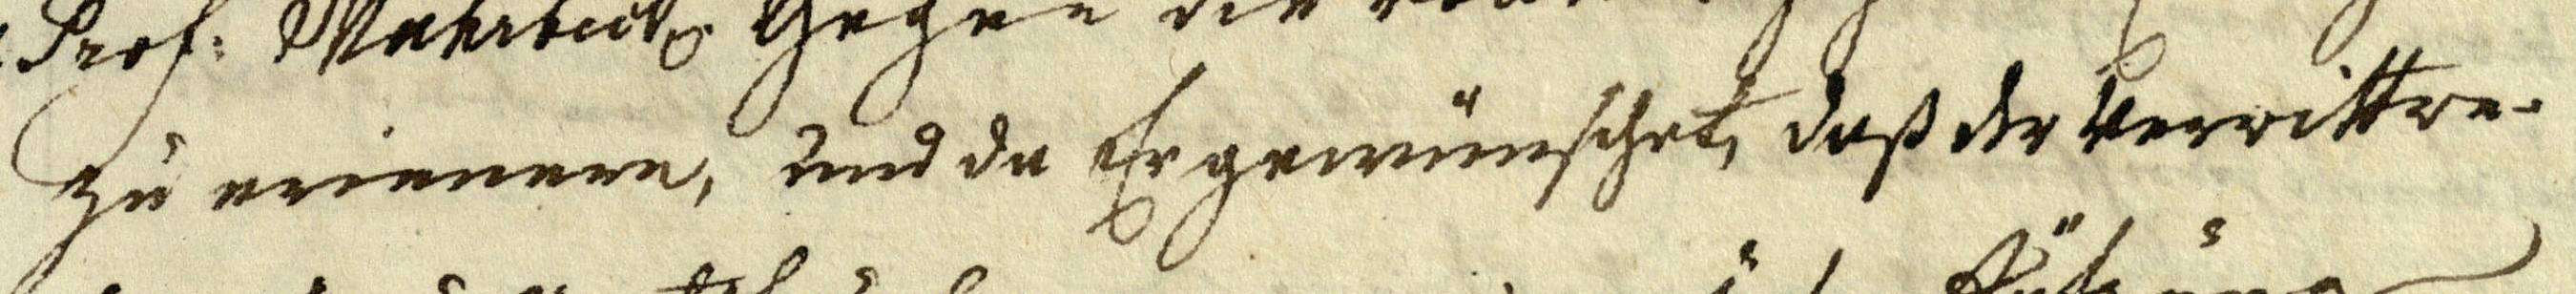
zu erinnern, und da Er gewünschet, daß der Verwittwe¬
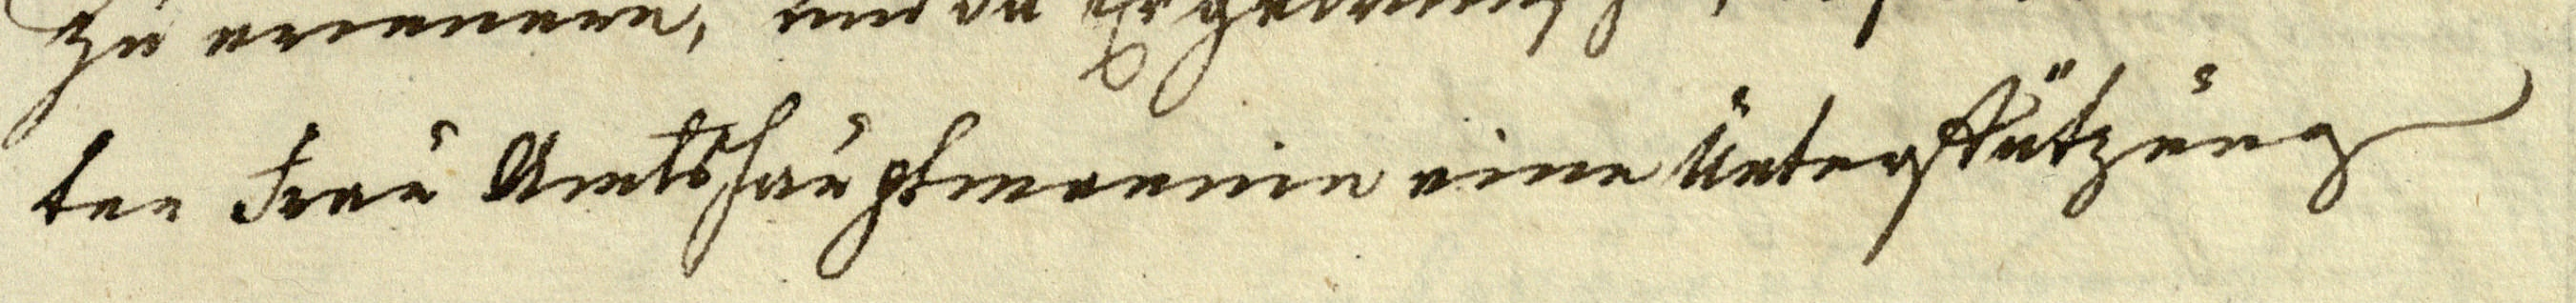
ten Frau Amtshauptmannin eine Unterstützung
